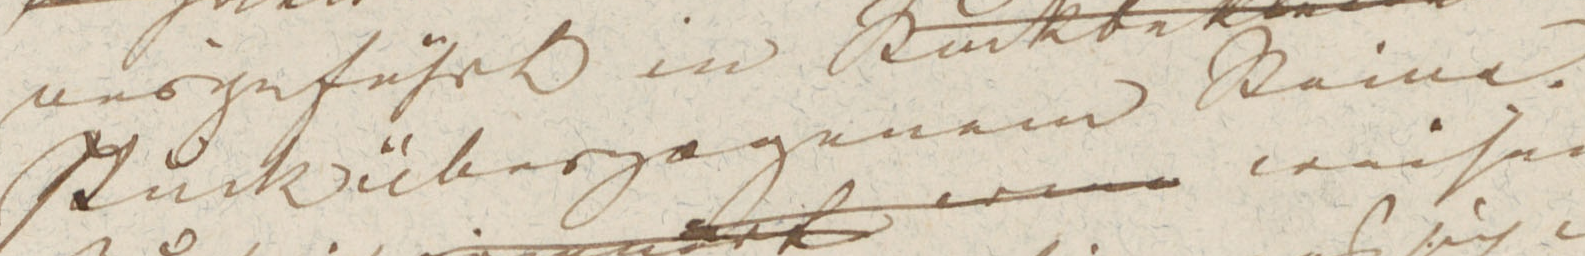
Ststucküberzogenem Steine.
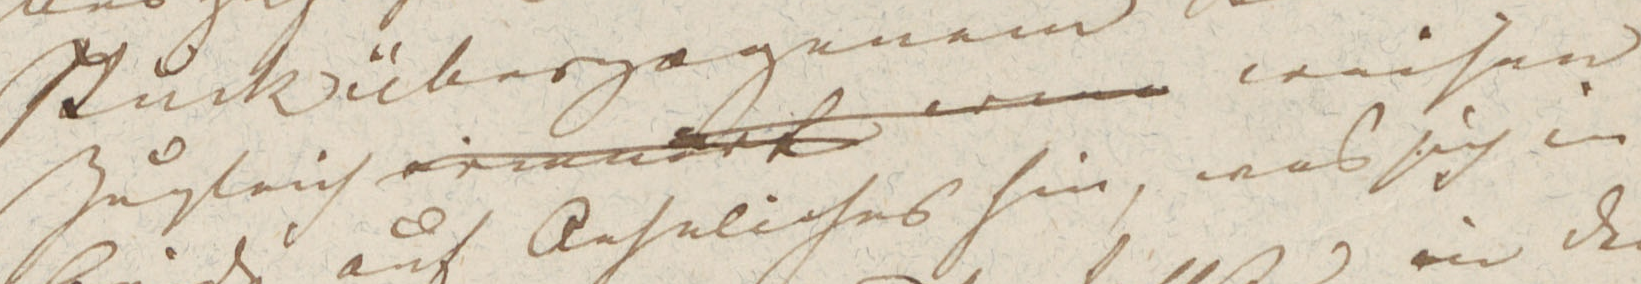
Zugleich erinnert erinn weisen
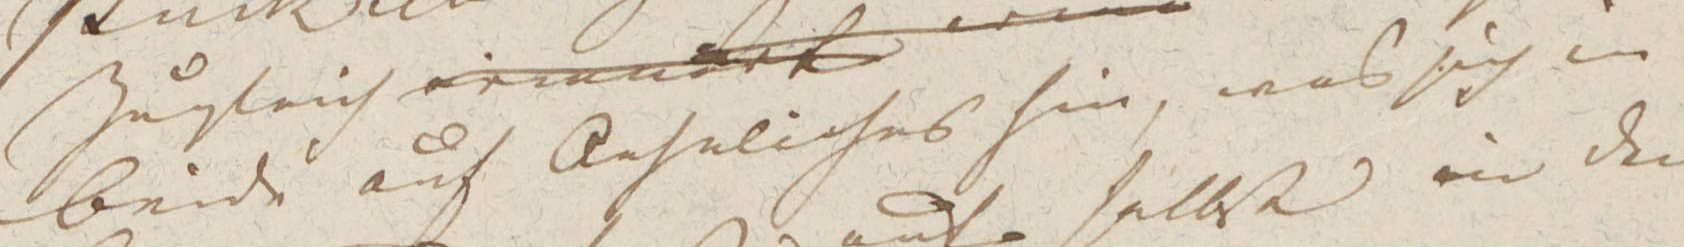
beide auf Aehnliches hin, was sich in
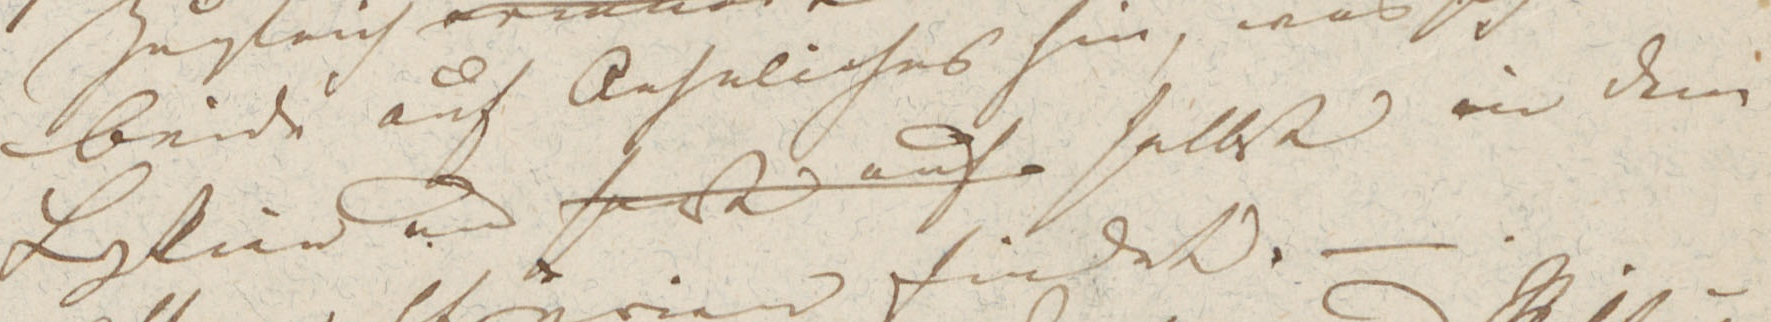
Lykien und sonst auf selbst in dem
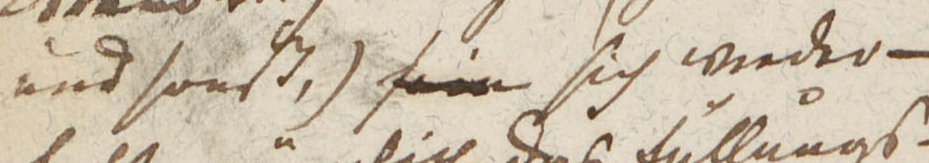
und sonst,) sein sich wieder-
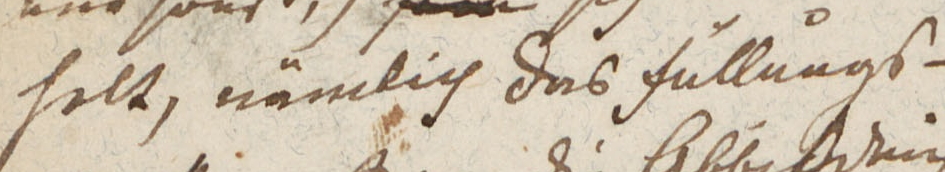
holt, nämlich das Füllungs-
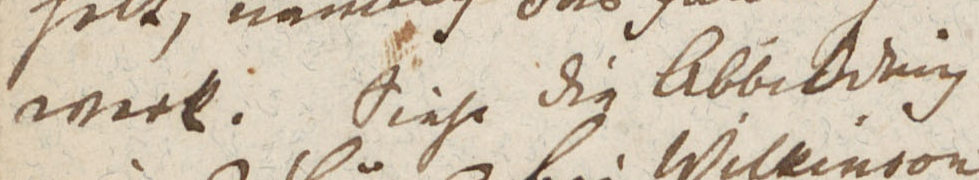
werk. Siehe die Abbildung
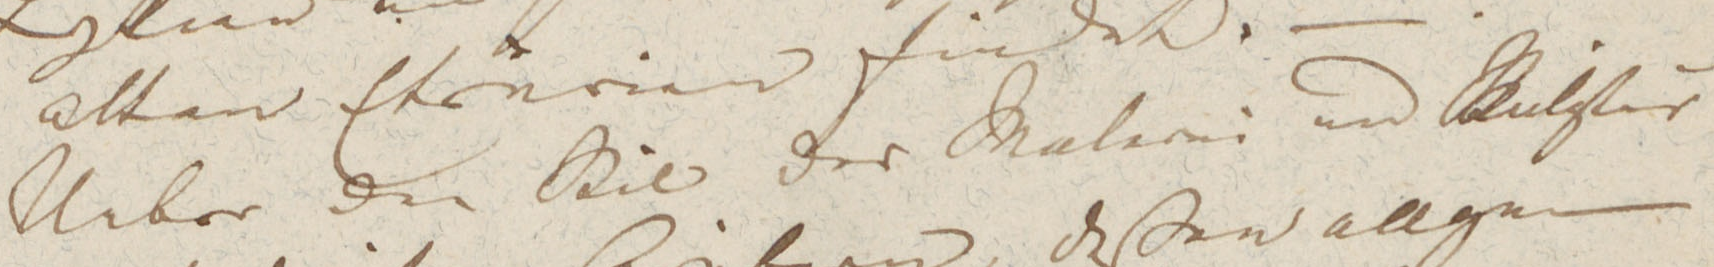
Ueber die Stil der Malerei und Skulptur
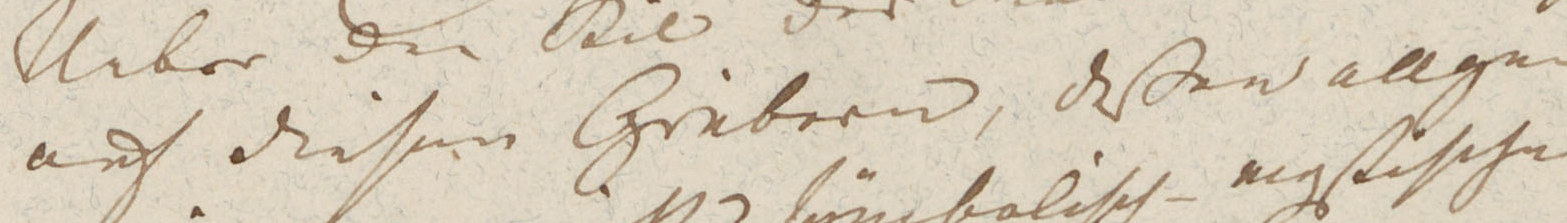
auf diesen Gräbern, dessen allge-
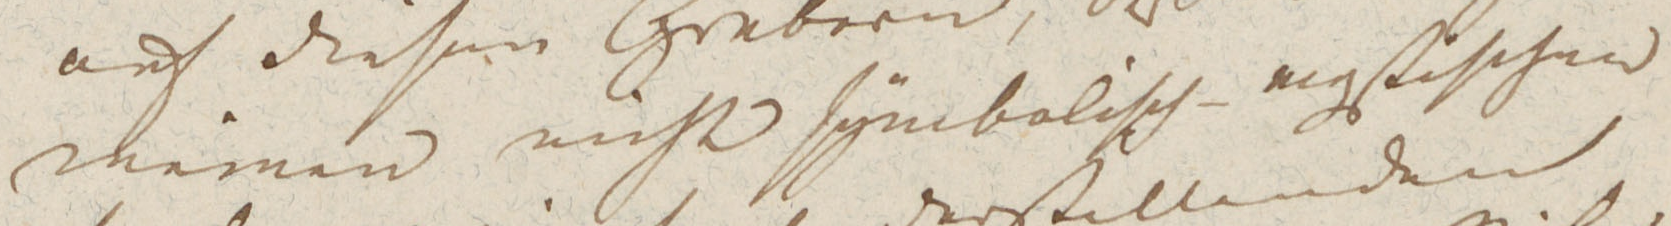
meinen nicht symbolisch-mystischen
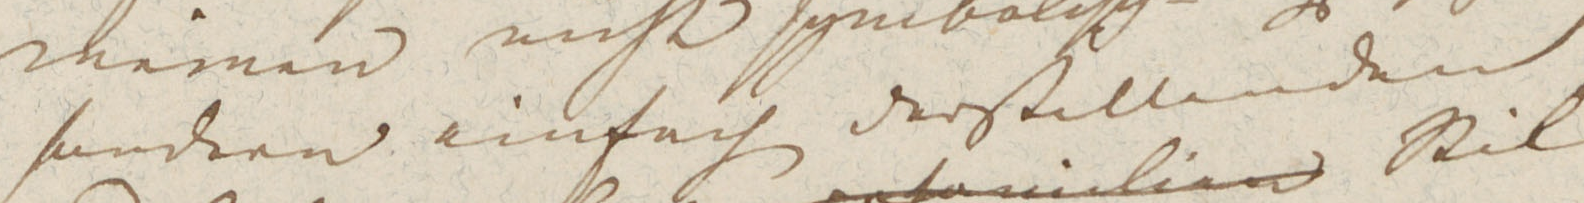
sondern einfach darstellenden
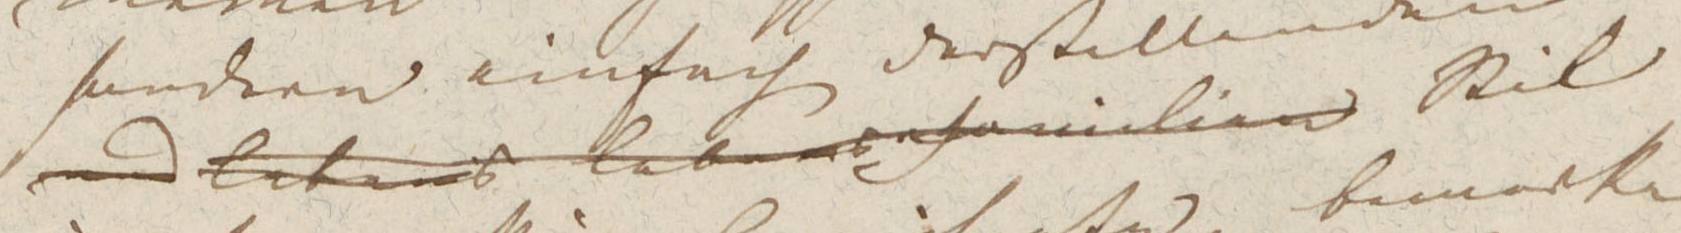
und lebens lebens Familien Stil
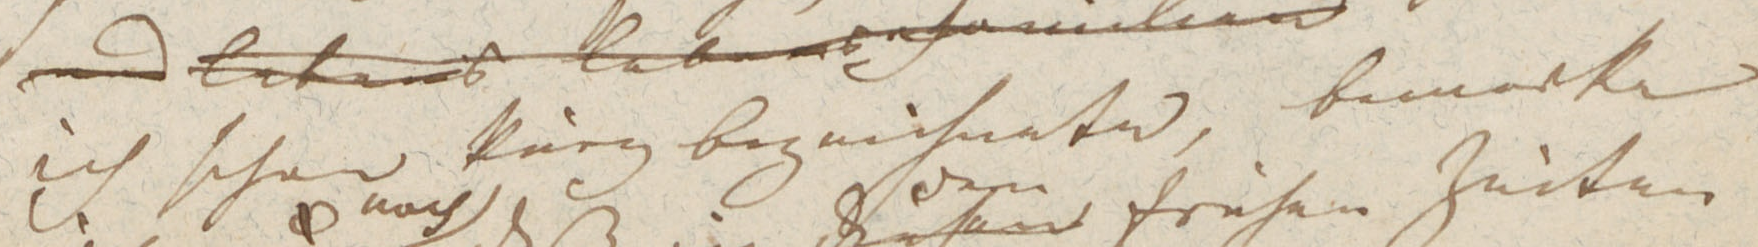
ich schon kurz bezeichnete, bemerke
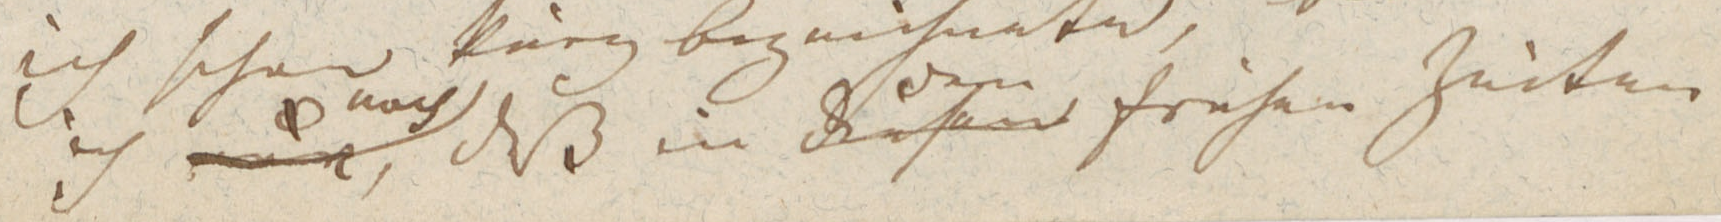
ich nun noch, dass in diesen den frühen Zeiten
